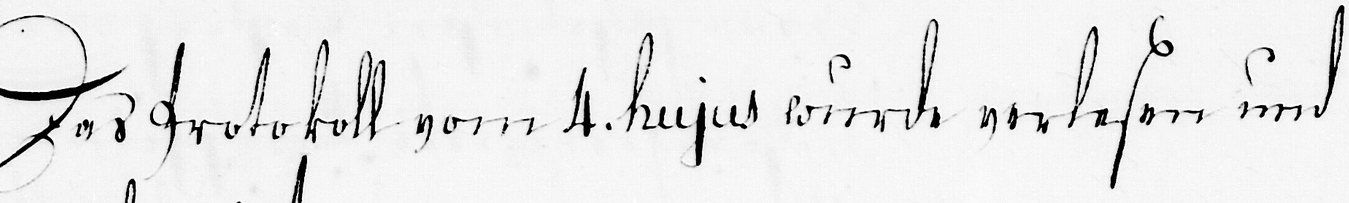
Das Protokoll vom 4. hujus wurde verlesen und
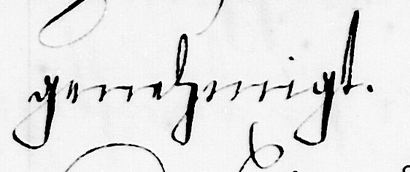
genehmigt.
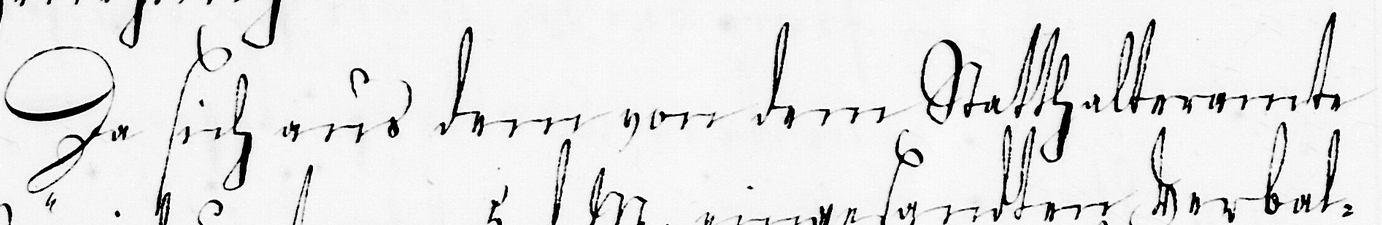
Da sich aus dem von dem Statthalteramte
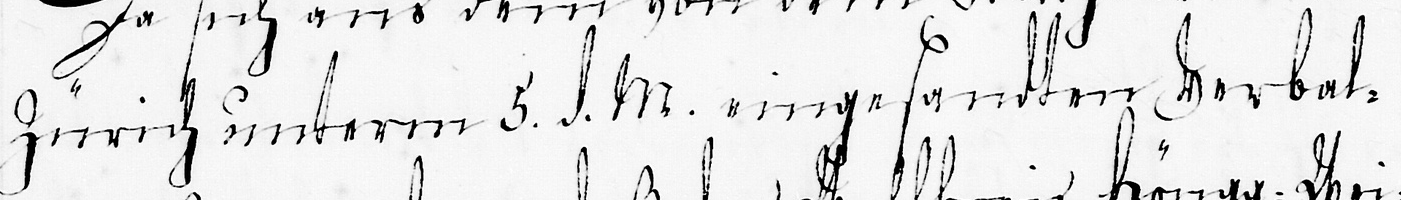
Zürich unterm 5. d. M. eingesandten Verbal¬
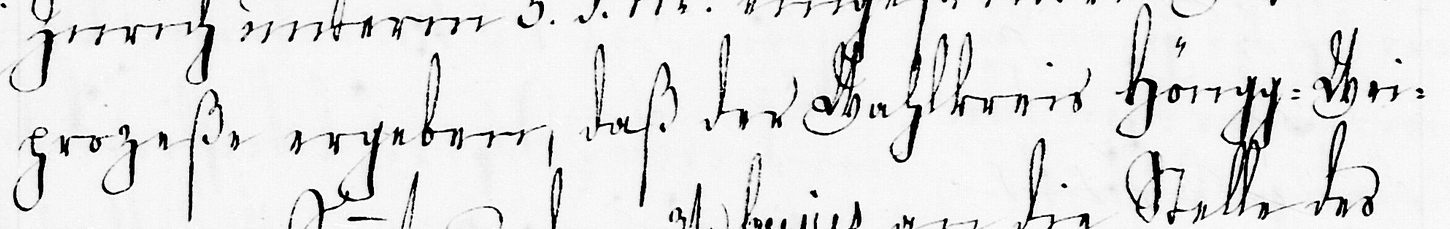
prozeße ergeben, daß der Wahlkreis Höngg-Wei¬
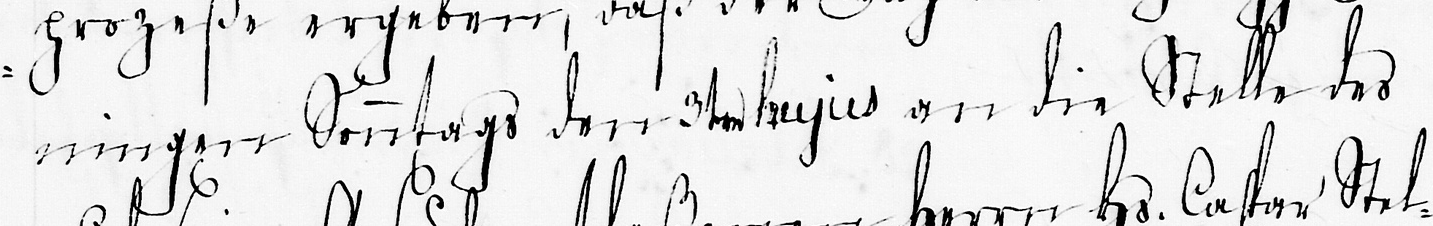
ningen Sonntags den 3ten hujus an die Stelle des
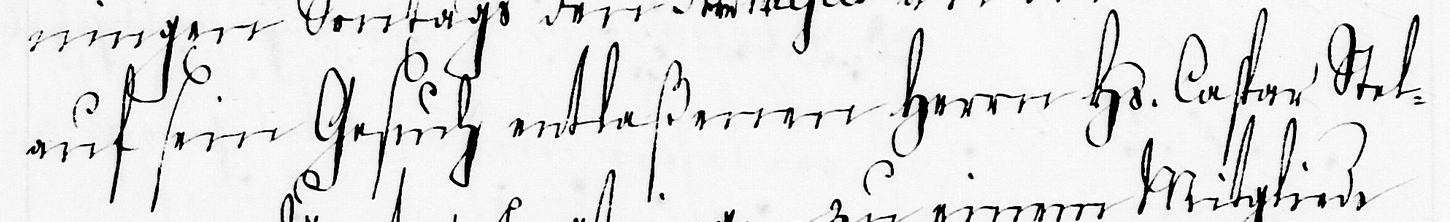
auf sein Gesuch entlaßenen Herrn Hs. Caspar Stel¬
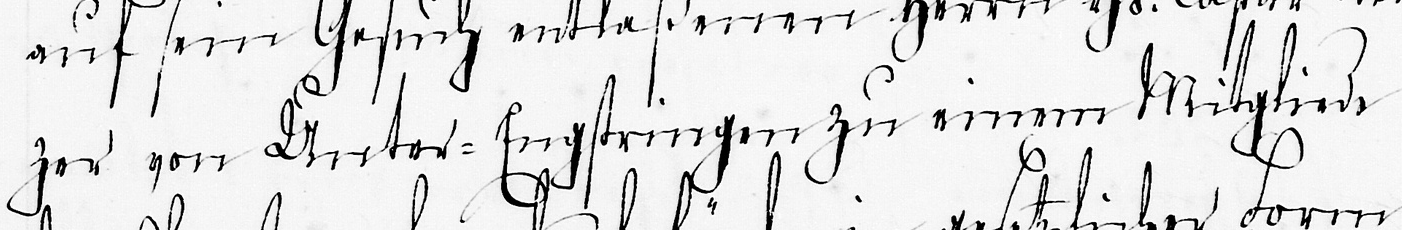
zer von Unter-Engstringen zu einem Mitgliede
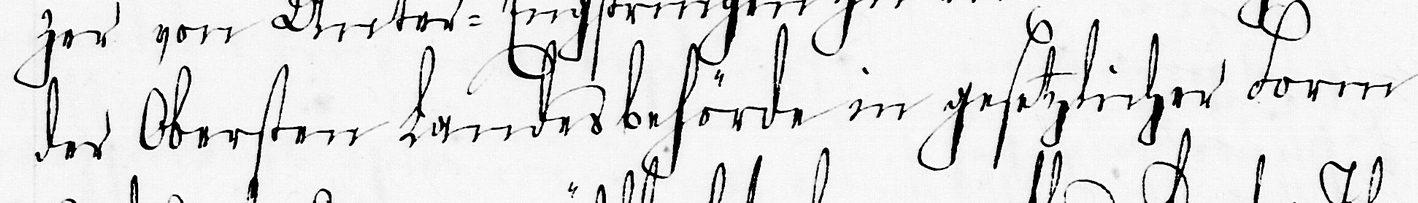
der Obersten Landesbehörde in gesetzlicher Form
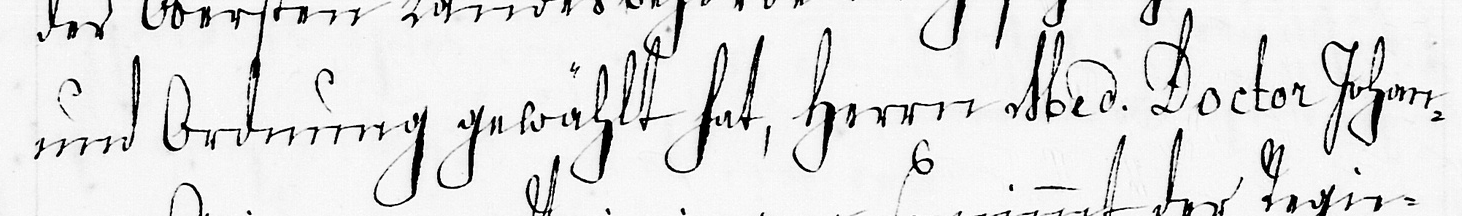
und Ordnung gewählt hat, Herrn Med. Doctor Johan¬
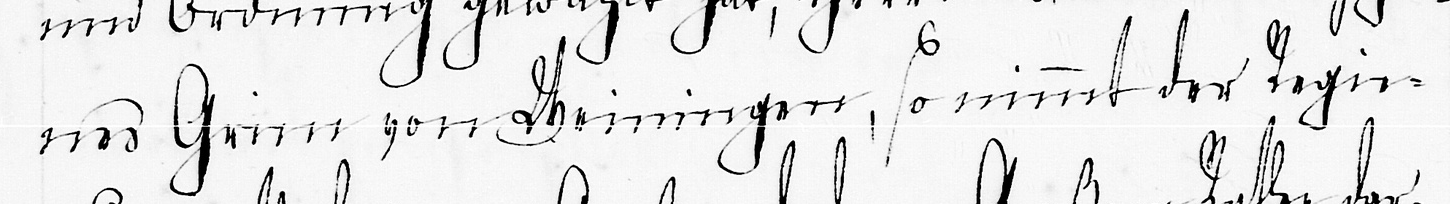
nes Grim [sic!] von Weiningen, so nimmt der Regie¬
